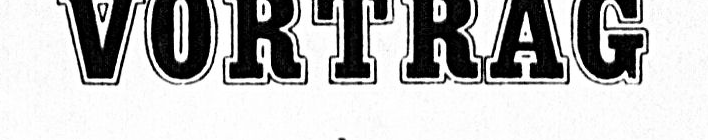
VORTRAG
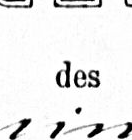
des
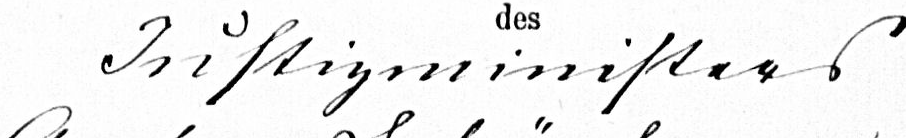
Justizministers
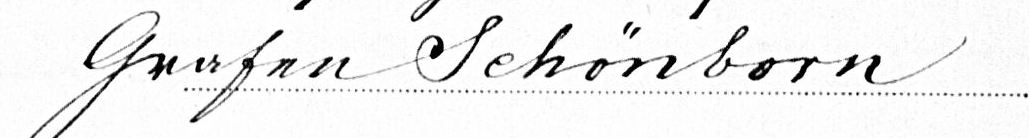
Grafen Schönborn
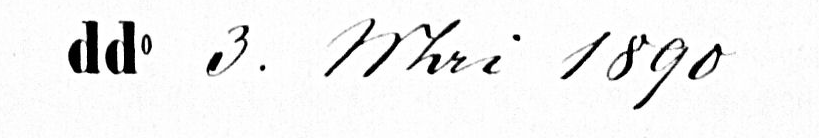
dd° 3. Mai 1890
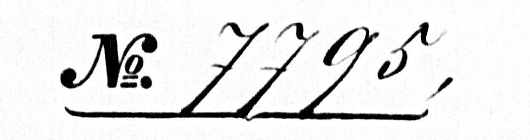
N° 7795,
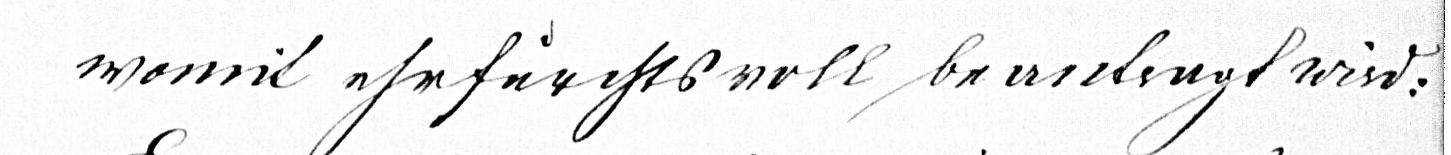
womit ehrfurchtsvoll beantragt wird:
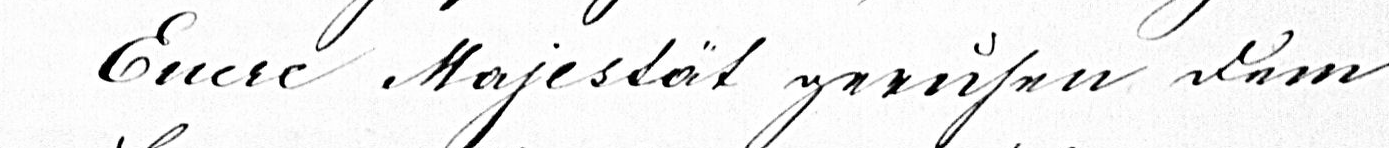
Euere Majestät geruhen dem
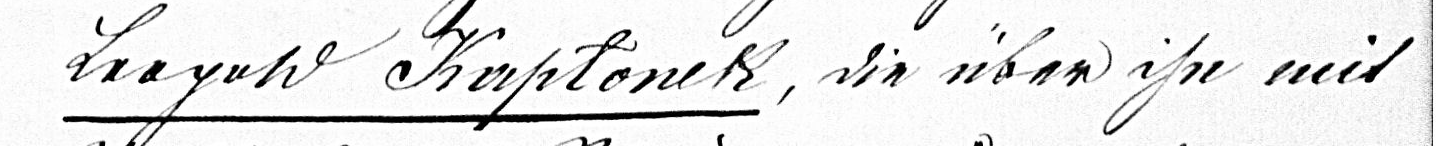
Leopold Kaptoxxk, die über ihr mit
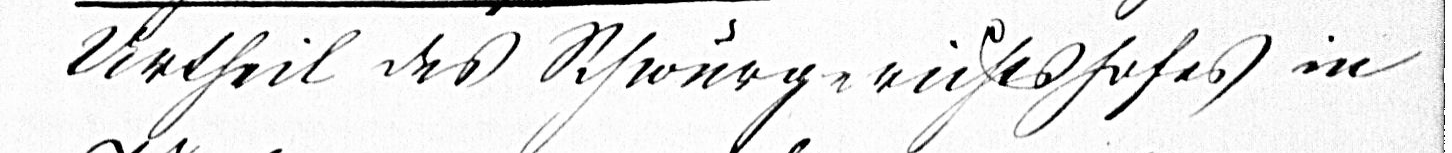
Urtheil des Schwurgerichshofes in
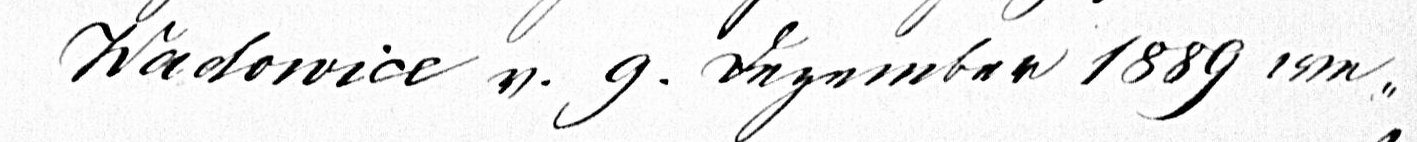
Wadowice v. 9. Dezember 1889 we¬
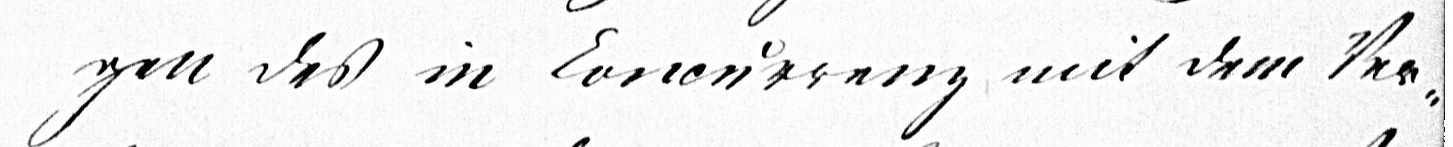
gen des in Concurrenz mit dem Ver
